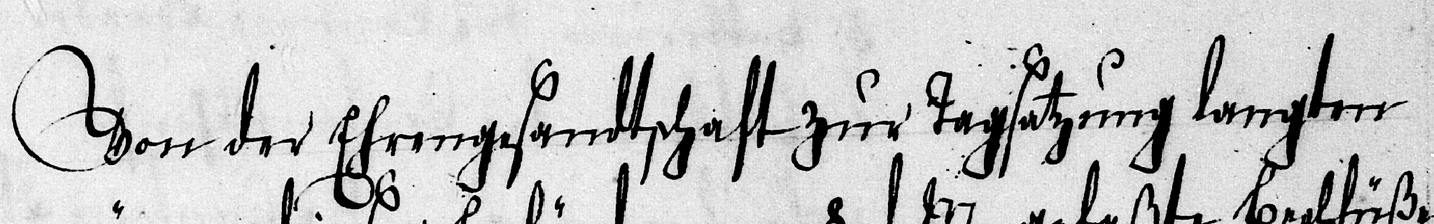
Von der Ehrengesandtschaft zur Tagsatzung langten
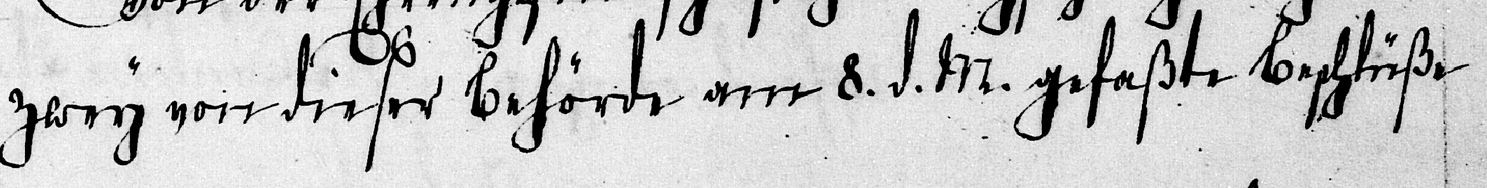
zwey von dieser Behörde am 8. d. M. gefaßte Beschlüße
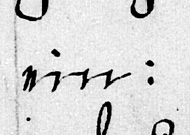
ein:
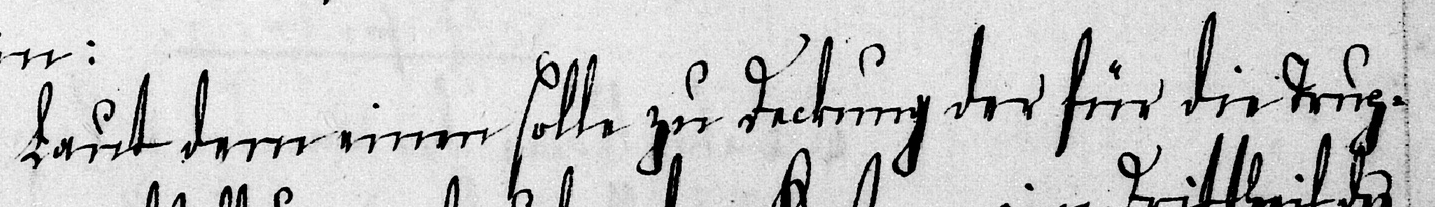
Laut dem einen solle zu Deckung der für die Trup¬
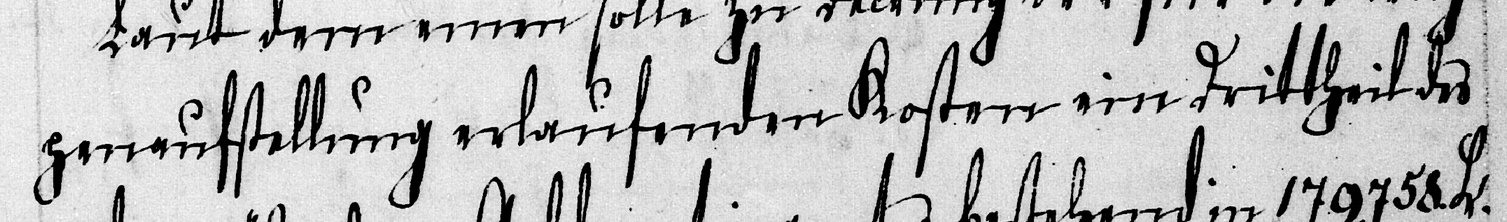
penaufstellung erlaufenden Kosten ein Drittheil des
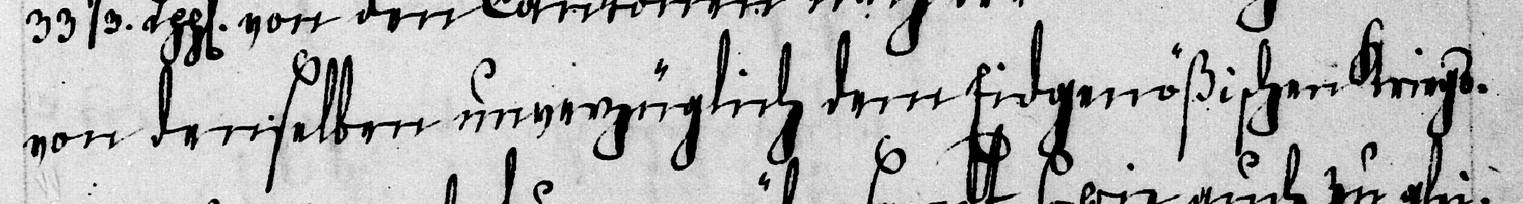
von denselben unverzüglich dem Eidgenößischen Kriegs¬
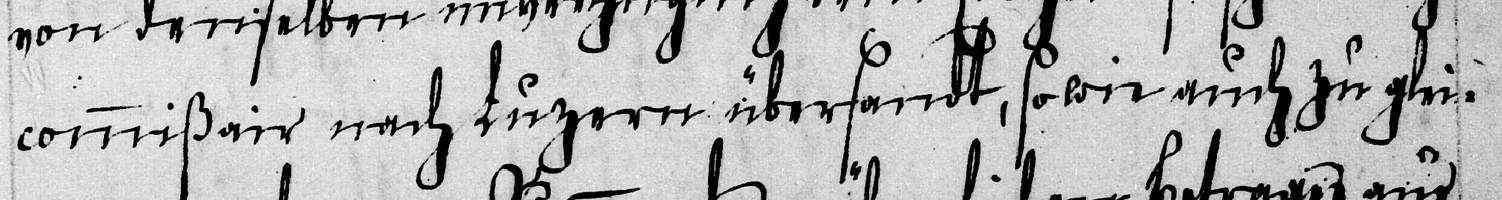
commißair nach Luzern übersandt, sowie auch zu glei¬
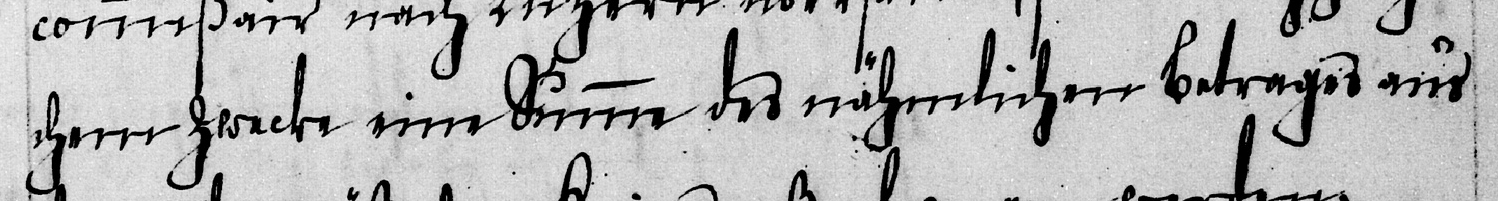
chem Zwecke eine Summe des nähmlichen Betrages aus
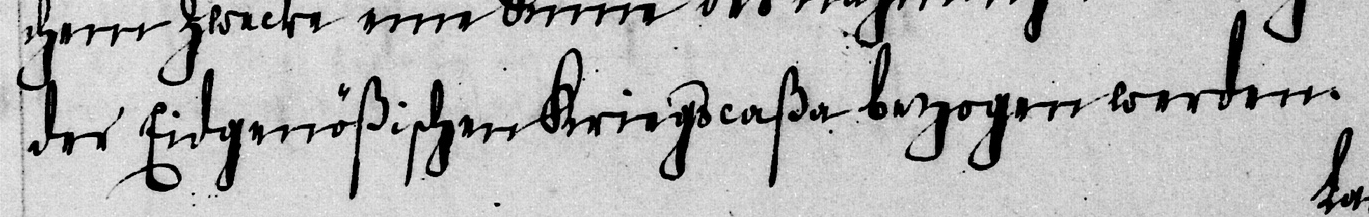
der Eidgenößischen Kriegscaßa bezogen werden.
